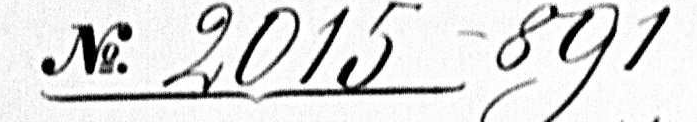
No 2015– 1891
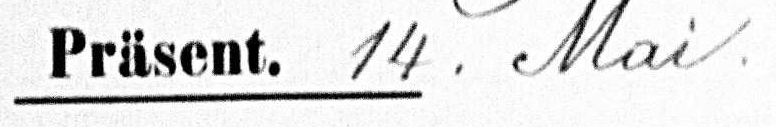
Präsent. – 14. Mai
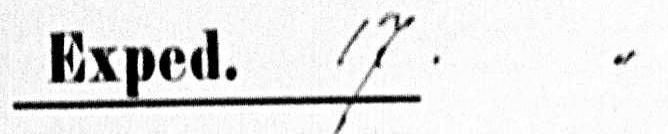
Exped. – 17. „
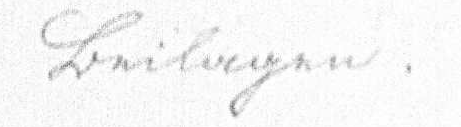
Beilagen
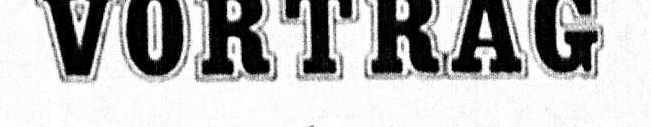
VORTRAG
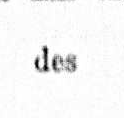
des
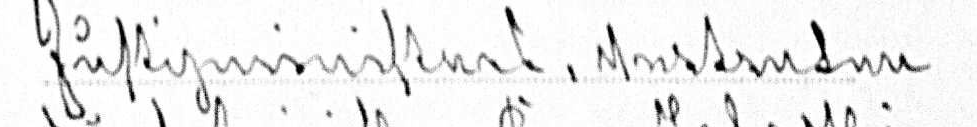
Justizministers, vertreten
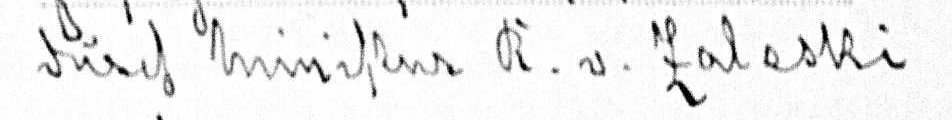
durch Minister R. von Zaleski
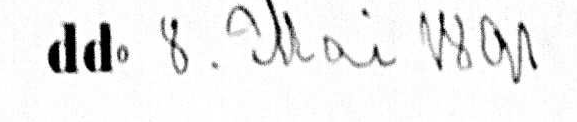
Ddo 8. Mai 1891
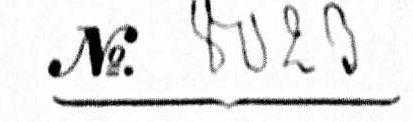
No. 8023
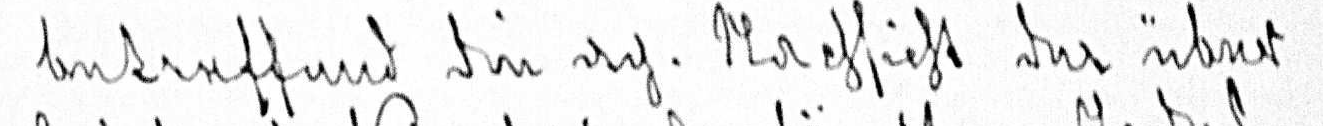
betreffend die ag. Nachsicht der über
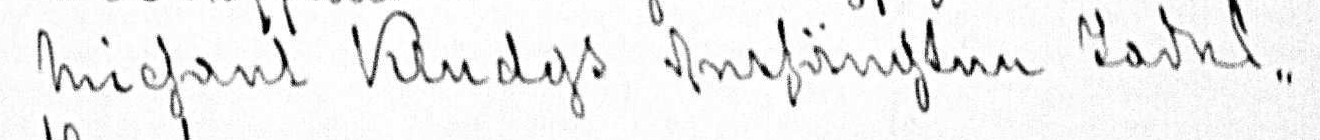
Michael Kludys verhängten Todes¬
